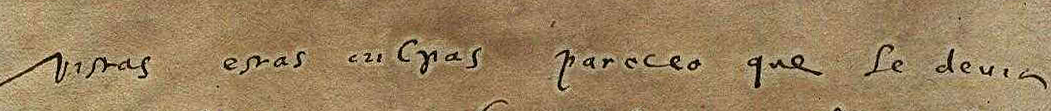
Vistas estas culpas pareceo que se deuia
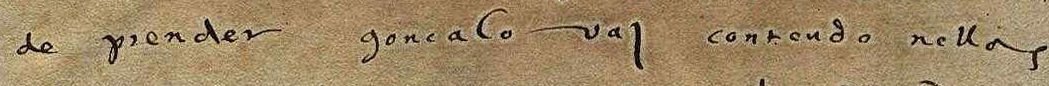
de prender goncalo vaz conteudo nellas
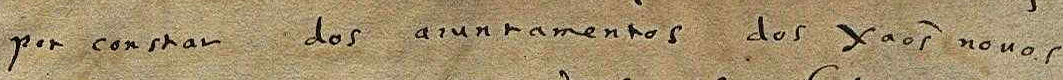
por constar dos aiuntamentos dos Xaõs nouos
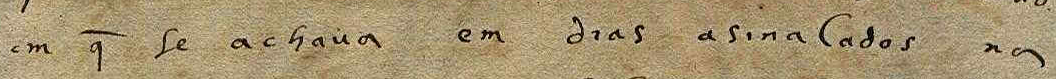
em q̄ se achaua em dias asinalados na
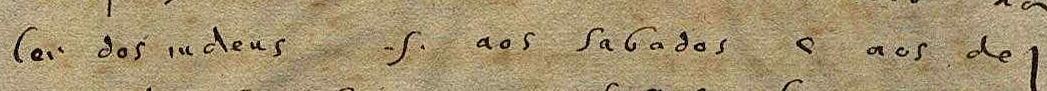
lei dos iudeus .s. aos sabados e aos dez
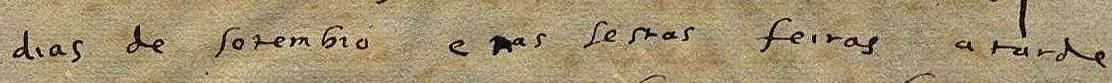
dias de setembro e nas sestas feiras a tarde
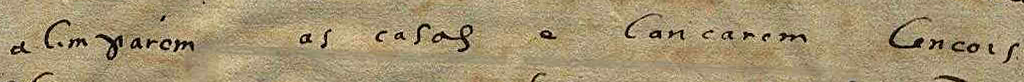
alimparem as casas e lancarem lencois
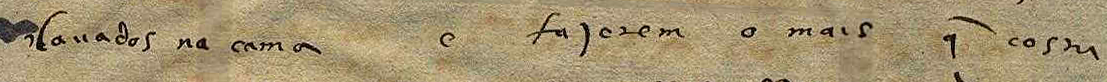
lauados na cama e fazerem o mais q̄ costu
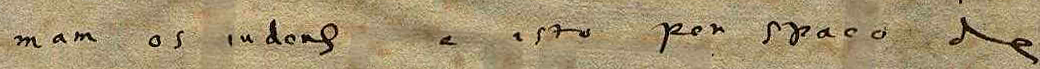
mam os iudeus e isto por spaco de
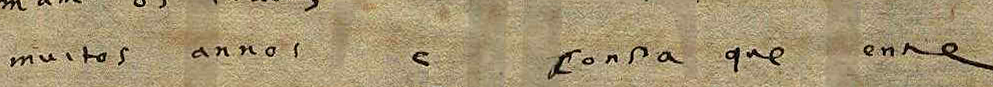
muitos annos e consta que entre
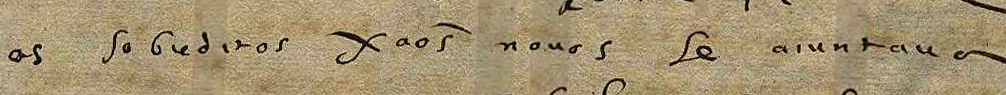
os sobreditos Xaõs nouos se aiuntaua
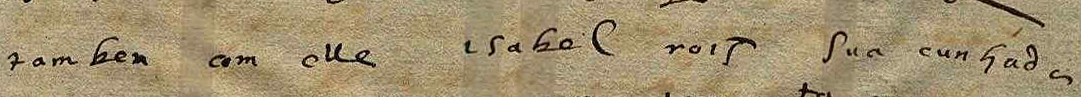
tambem com elle isabel rois̄ sua cunhada
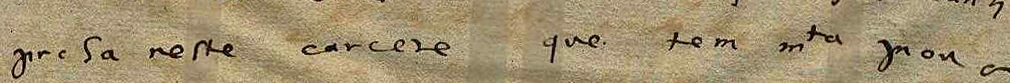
presa neste carcere que tem mta proua
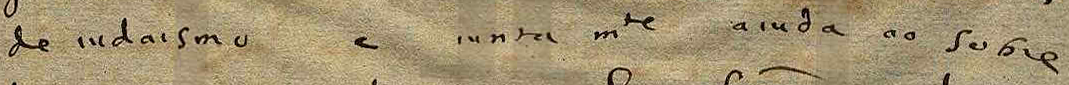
de iudaismo e iuntamte ainda ao sobre
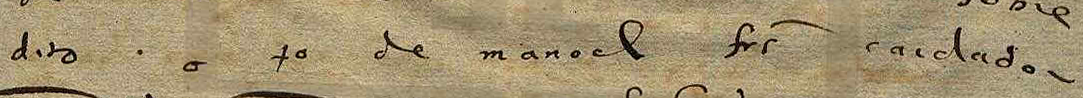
dito o to de manoel frs̄ cardador
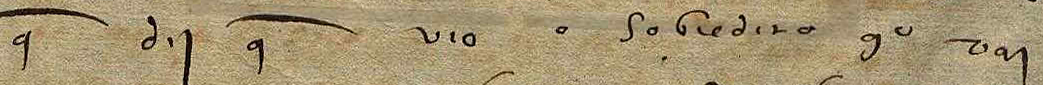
q̄ diz q̄ vio o sobredito go vaz
